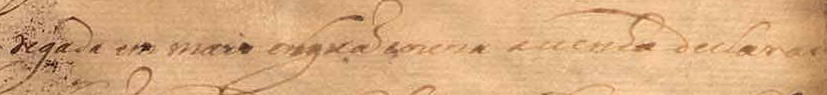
regada em mais alguā couza a uenha declarar
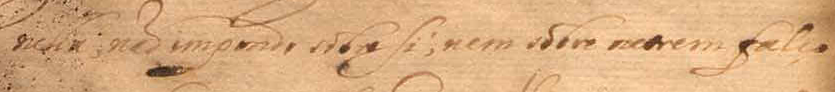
nella, naõ impondo sobre si, nem sobre outrem falço
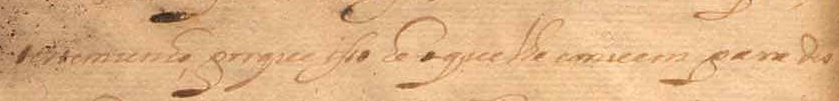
testemunho, porque isso he o que lhe conuem para des
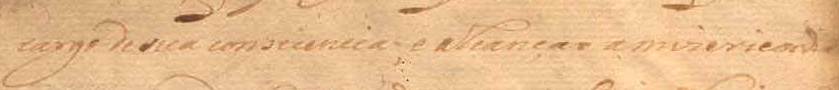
cargo de sua consciencia, e alcançar a mizericordia
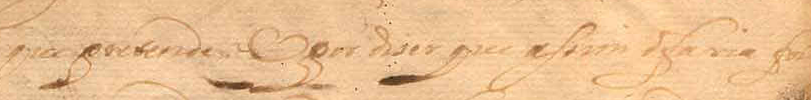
que pretende. E por dizer que assim o faria foi
